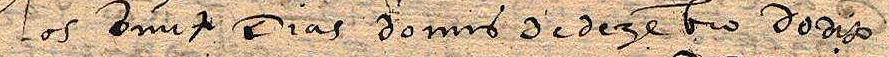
Aos vimte dias do mes de dezēbro do dito
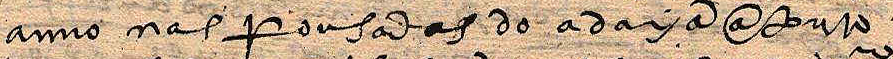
anno nas pousadas do adayā ātonjo
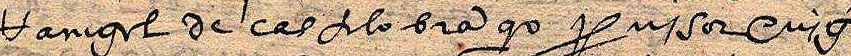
Ramgel de castelo brāqo ꝓujsor e ujgro
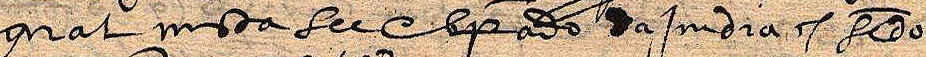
geraL nesta see e bpādo da Jmdia cꝭ sēdo
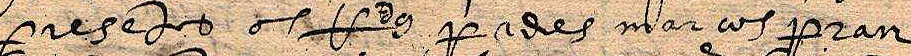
presētes os Rdꝯ padres marcos pran
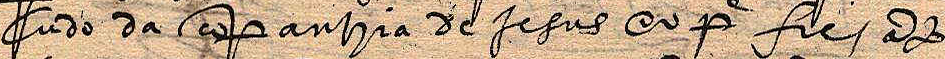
Cudo da c̄opanhia de Jesus e o pe frej āto
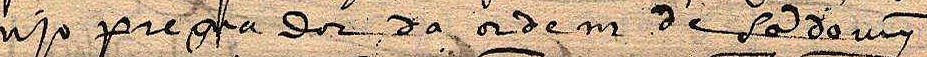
njo preguador da ordem de sā domȳ
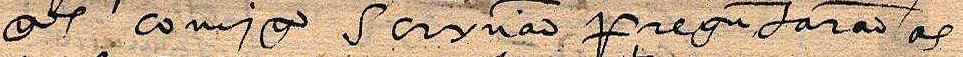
gos comjgo scryuão pregūtarão as
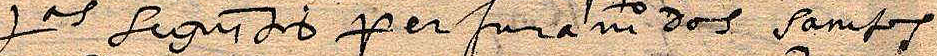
tas seguītes per Juramto dos samtos
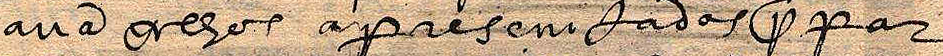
auāgelhos apresemtadas p̄o par
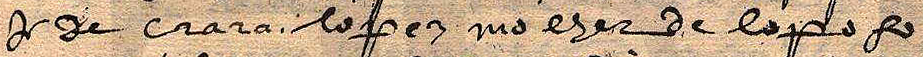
te de crara lopez molher de lopo so
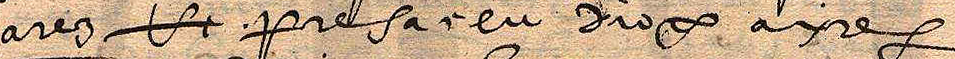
arez Re presa e eu diogo ayres
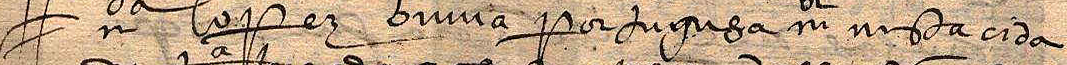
item mda lopez viuua portugusa mor nesta cida
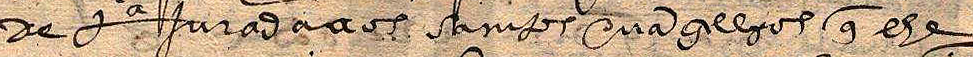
de ta Jurada aos samtos euāgelhos q̄ lhe
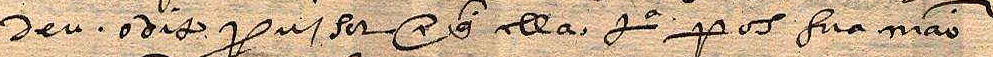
deu . o dito ꝓujsor ē q̄ ella ta pos sua mão
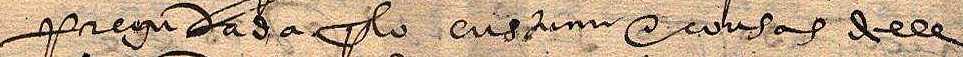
pregūtadas p̄lo custume e cousas delle
